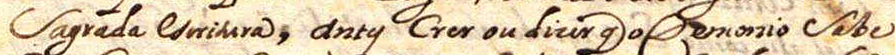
Sagrada escritura, antes Crer ou dizer q̄ o Demonio Sabe
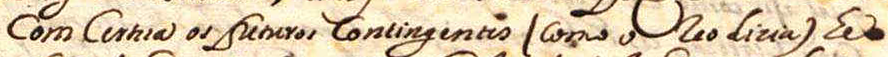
Com Certesa os futuros Contingentes (como o Reo dizia) he
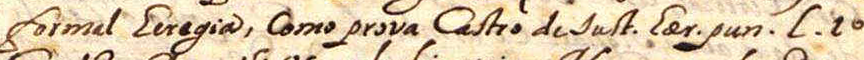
formal heregia, como prova Castro de Iust. hær. pun. l. 1o
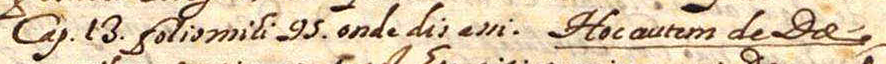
Cap. 13. folio mihi 95. onde dis assi. Hoc autem de Dæ
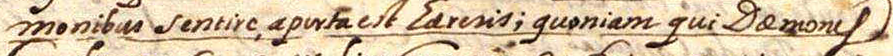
monibus sentire, aperta est hæresis; quoniam qui Dæmones
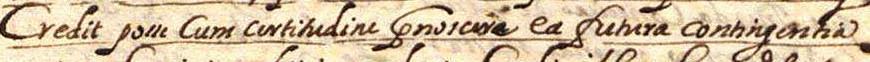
Credit posse cum certitudine p̄ noscere ea futura contingentia
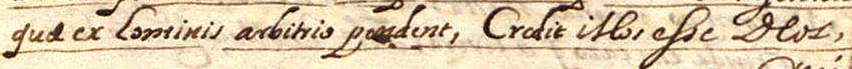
quæ ex hominis arbitrio pendent, Credit illos esse Deoz
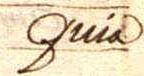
Quia
